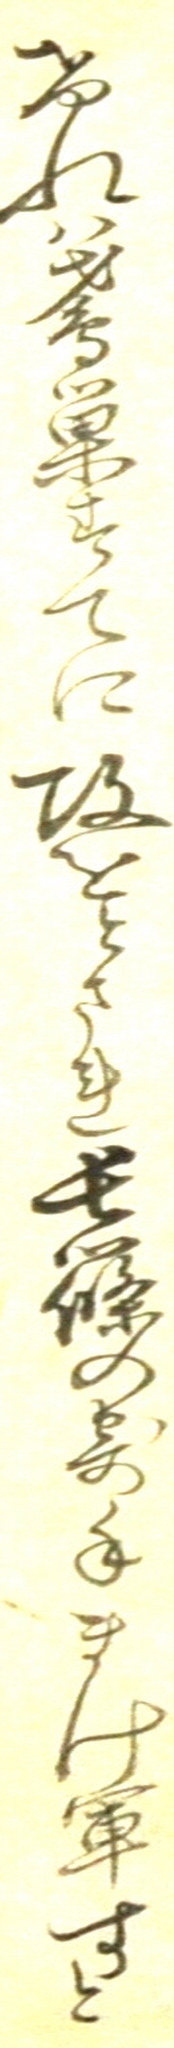けれは鳶巣すてに攻をとされ長篠の寄手まけ軍すと
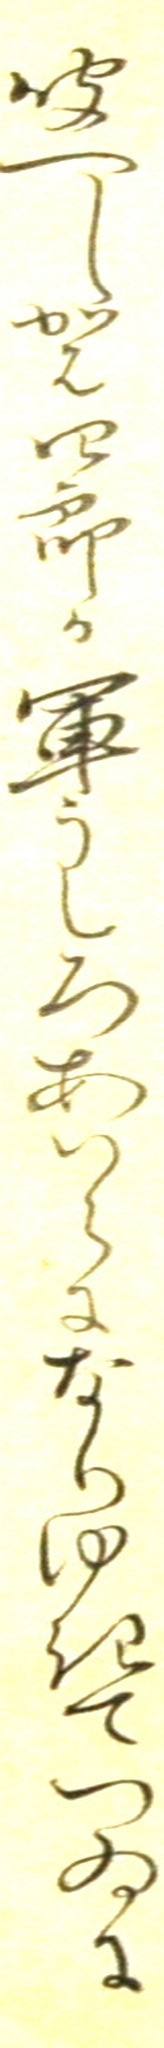聞へしかは四郎か軍うしろあいらになりゆきてつゐに

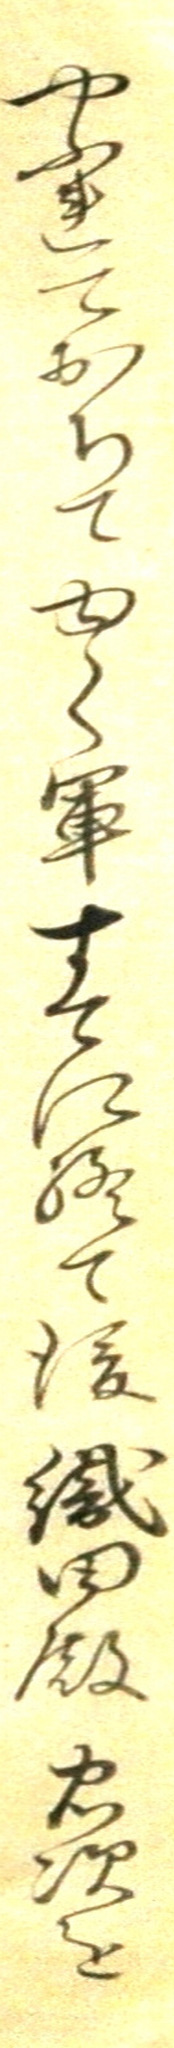やふれておちてゆく軍すてに終て後織田殿忠次を
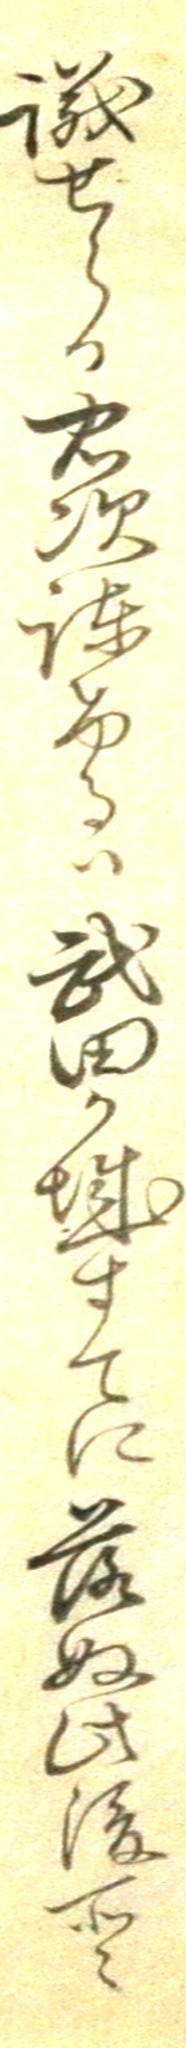議せらる忠次諫けるは武田か城すてに落ぬ此後所々
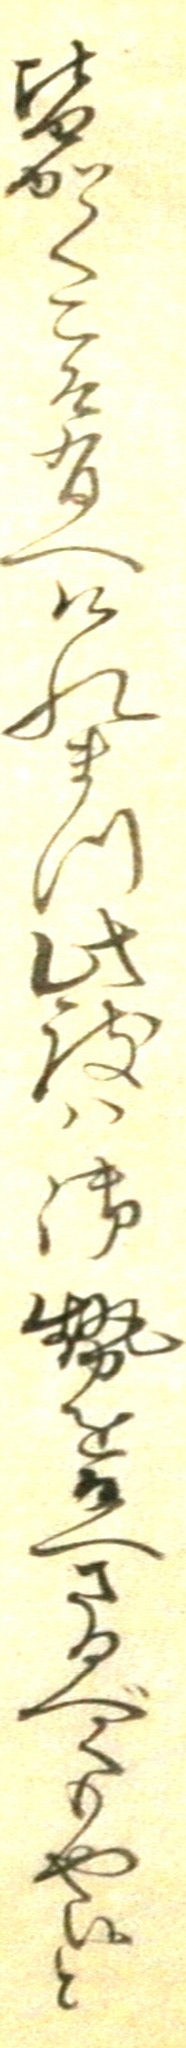皆かくこそ有へけれまつ此度は御勢をかへさるべくもや候と
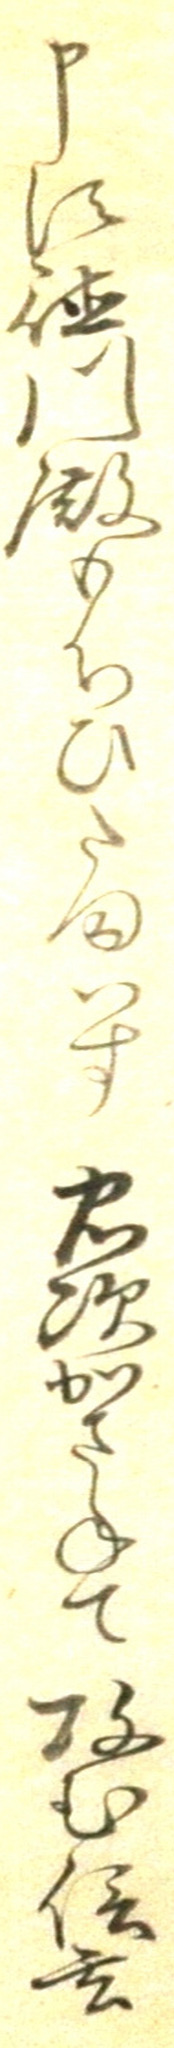申す徳川殿もちひたまはす忠次かさねて攻む信玄
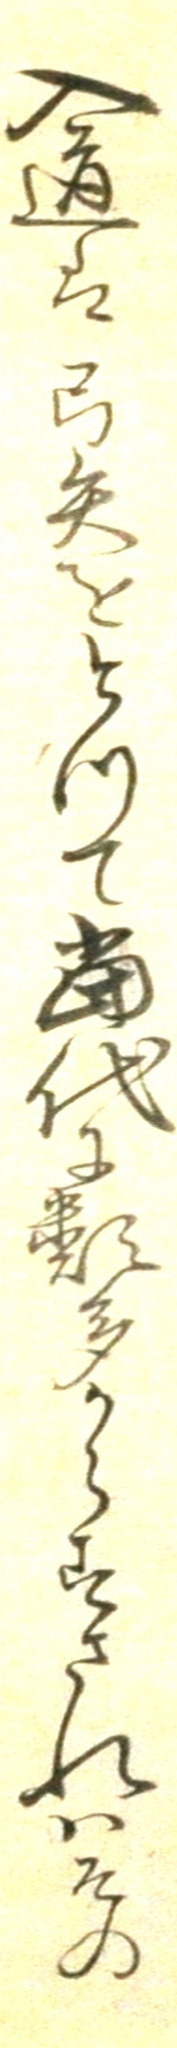入道は弓矢をとつて当代に類多からすされはその
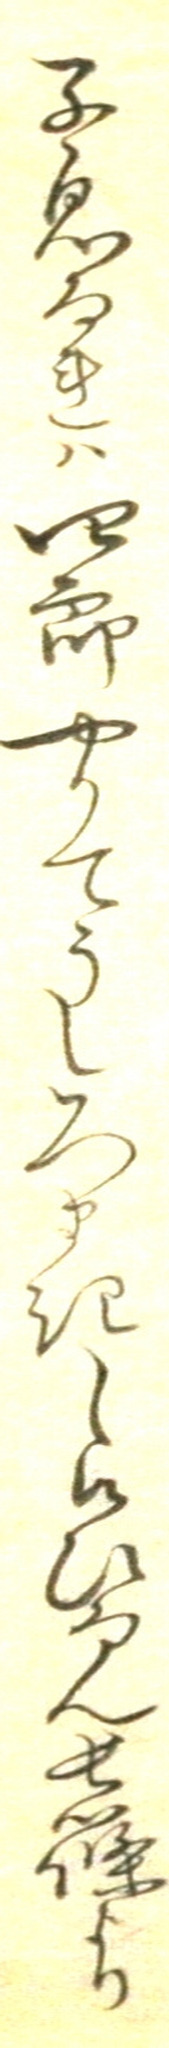子息なれは四郎やかてうしろまきし候ひなん長篠より
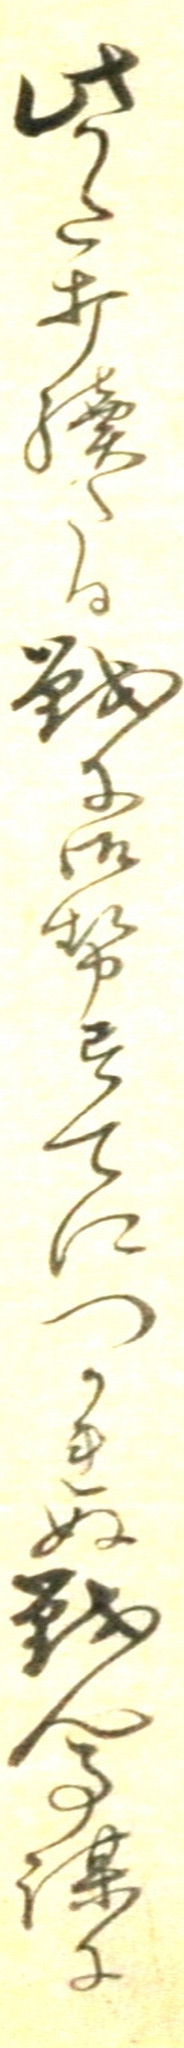此かた打続たる戦に御勢すてにつかれぬ戦ん事謀に
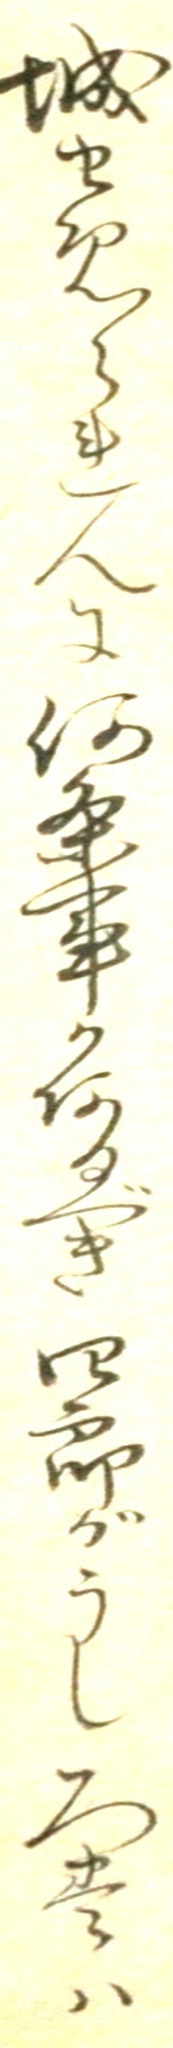城せめられんに何条事かあるべき四郎がうしろ巻は
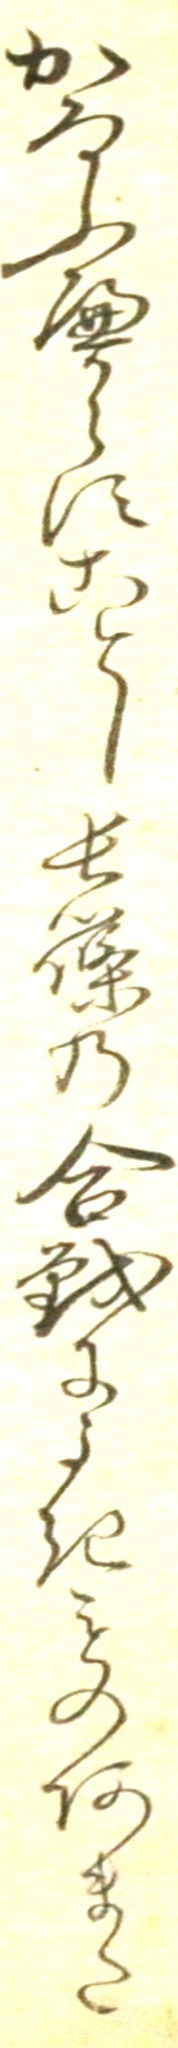かなふへからすことし長篠の合戦によきものあまた
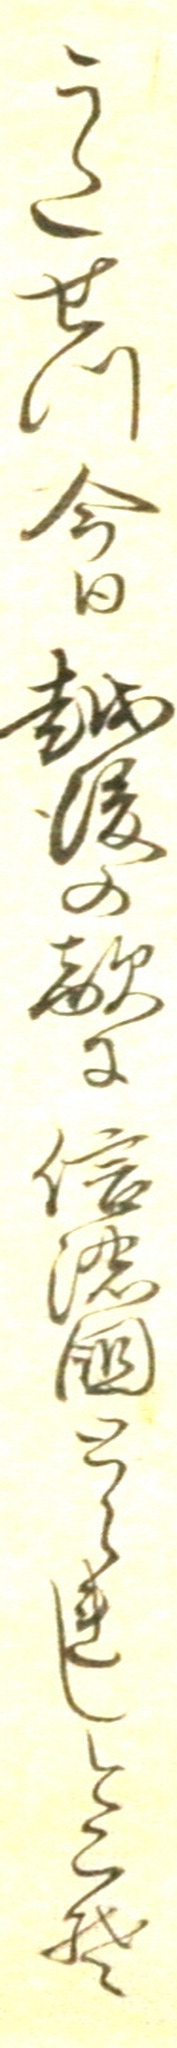うたせつ今日越後の敵に信濃国とられしとこそ
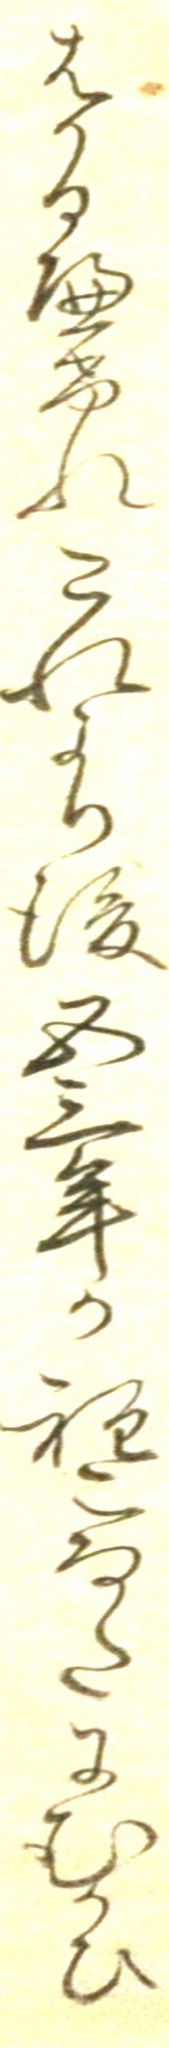はかるへけれこれより後五三年か程こなたにむかひ
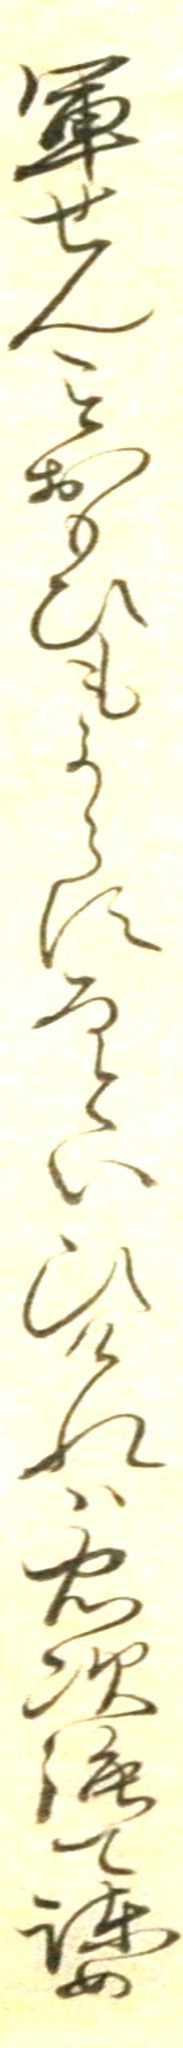軍せんことおもひもよらすなといひけれは忠次強て諫め
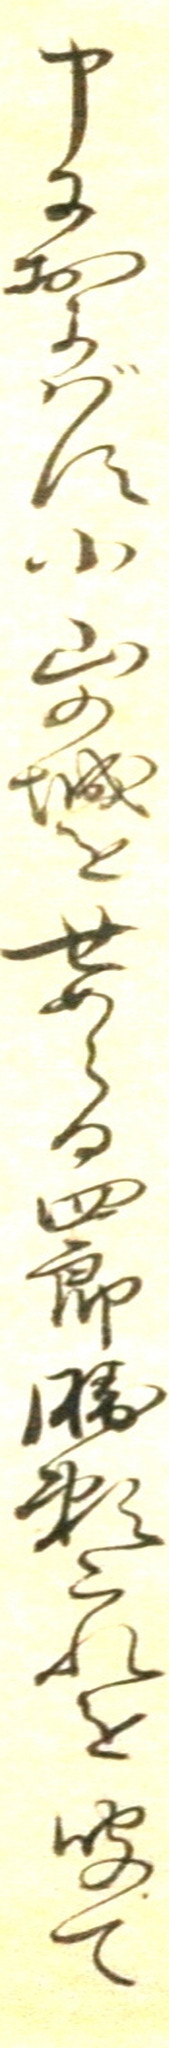申におよばす小山の城をせめらる四郎勝頼これを聞て
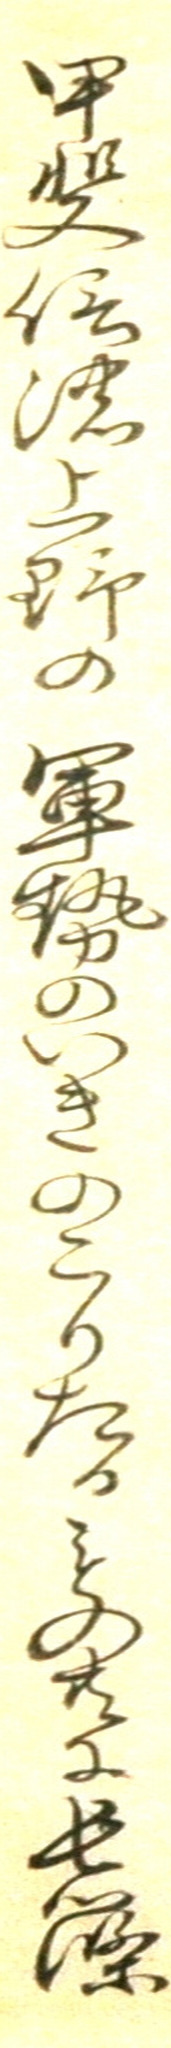甲斐信濃上野の軍勢のいきのこりたるもの共に長篠
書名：藩翰譜（四・上）
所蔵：伊那市立高遠町図書館・合同会社AMANE
